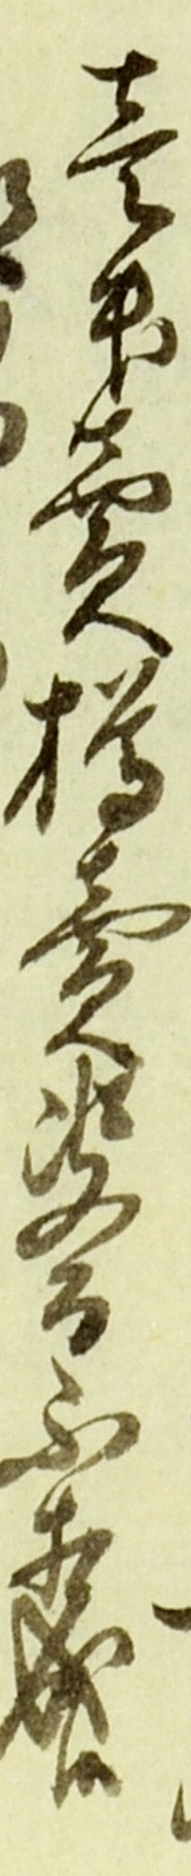壱本売樽売決而不相成候
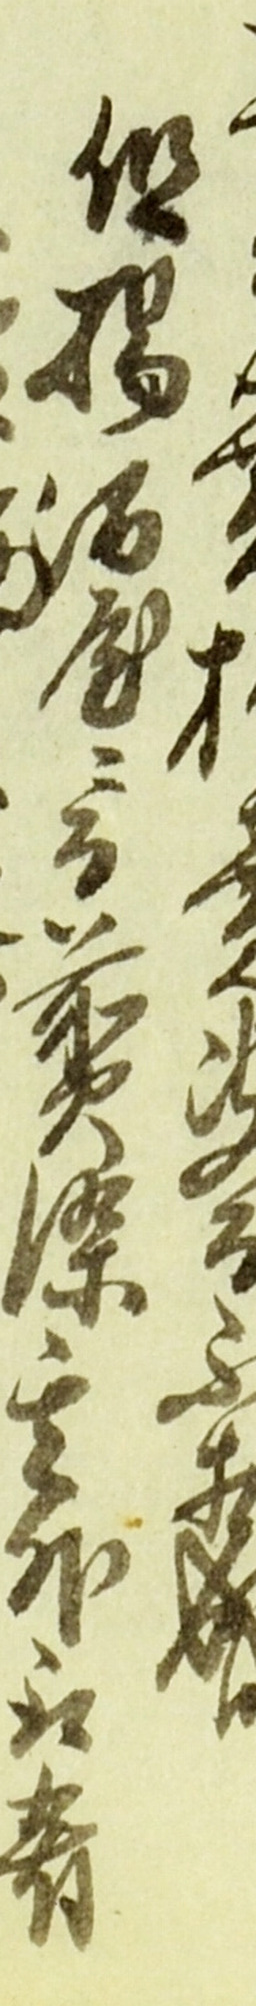但揚酒屋ニ而煎染其外取肴
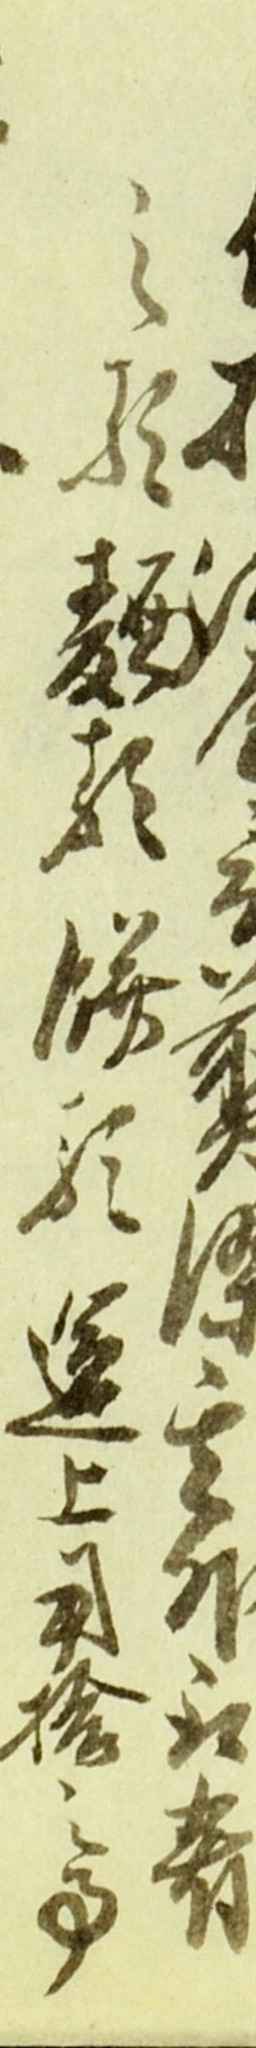之類麺類餅類運上用捨之事
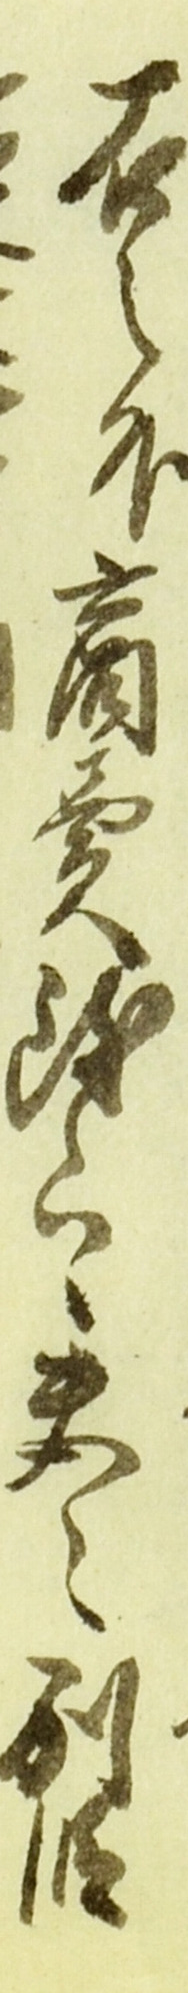右之外商売致候ハゝ夫々別段
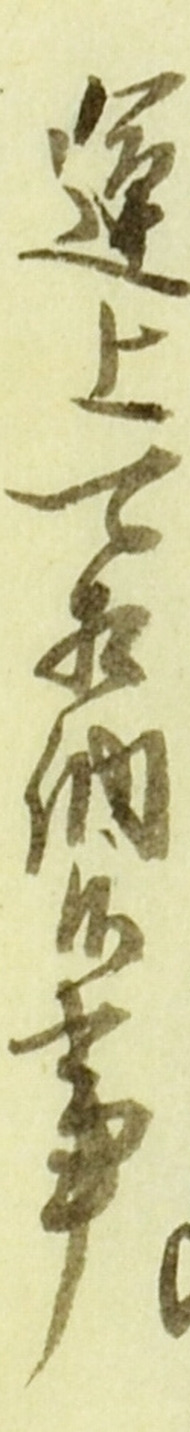運上可相納候事
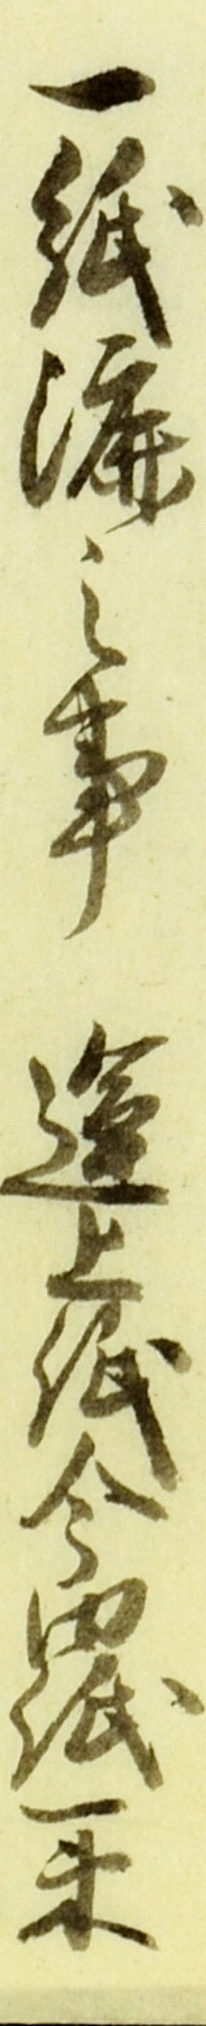一紙漉之事運上紙今田紙四紙一束
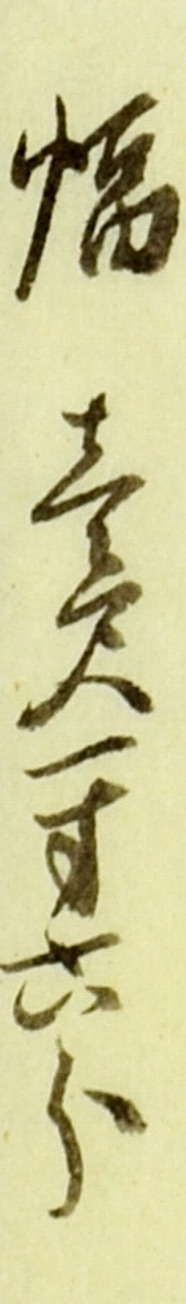幅壱尺一寸六分
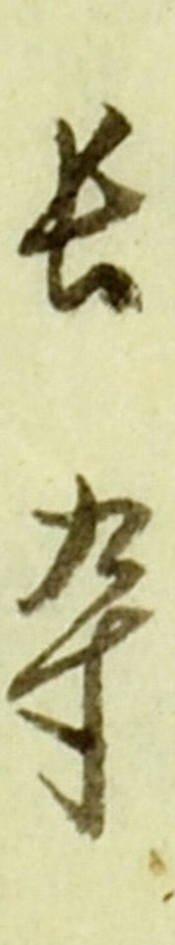長九寸
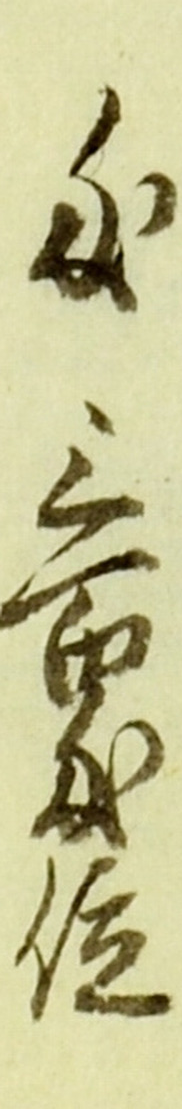匁三百匁位
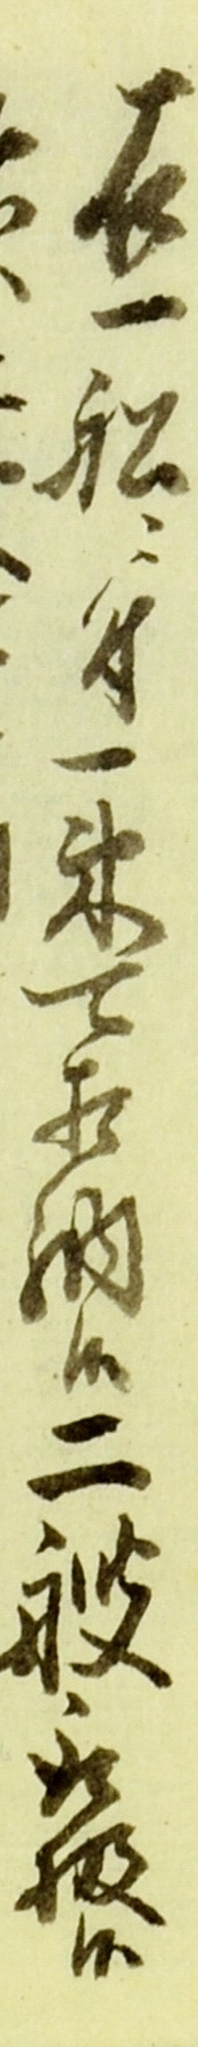右一船ニ付一束可相納候二船取扱候
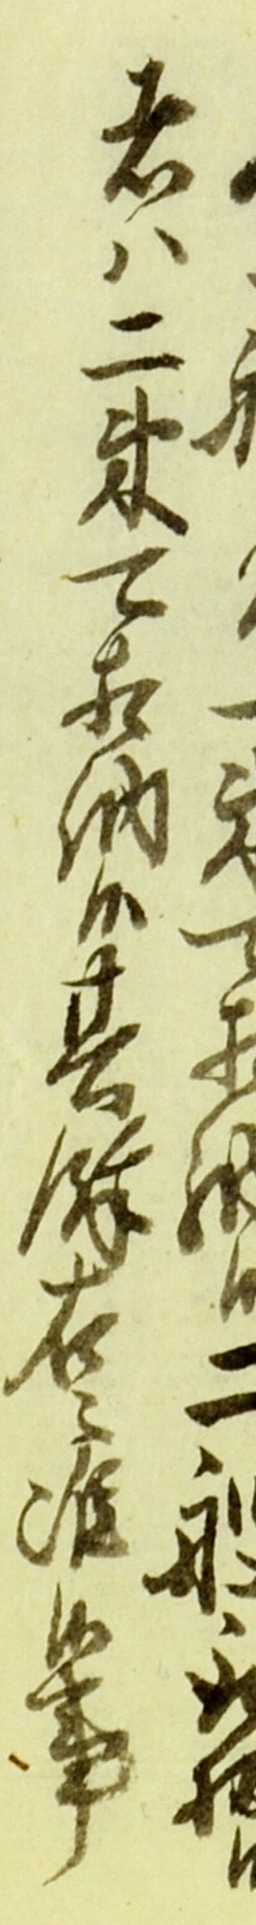者ハ二束可相納候其余右ニ准候事
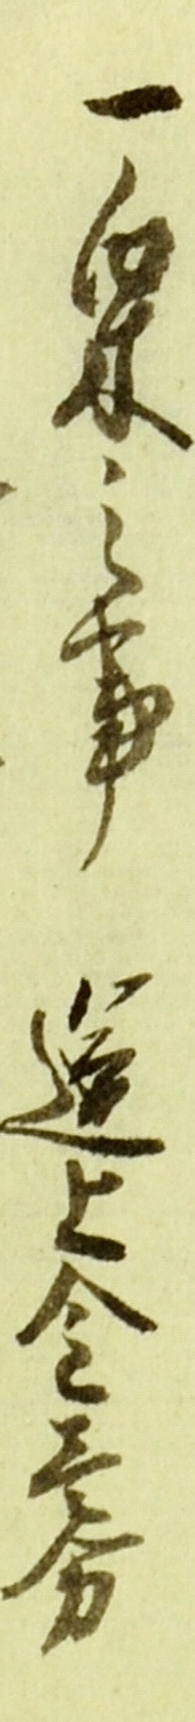一白木之事運上金壱分
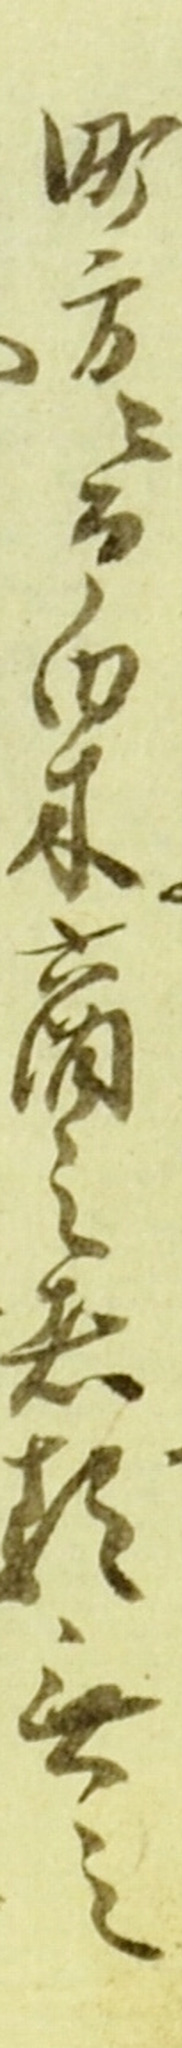町方ニ而白木商之者類無之
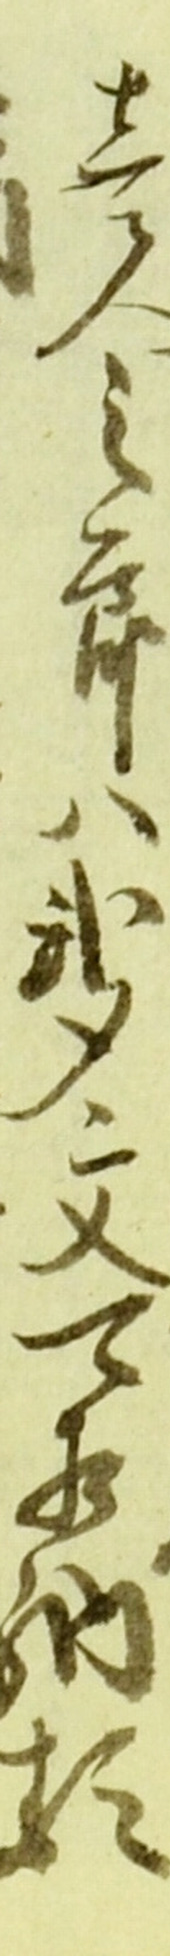壱人之節ハ弐貫文可相納類
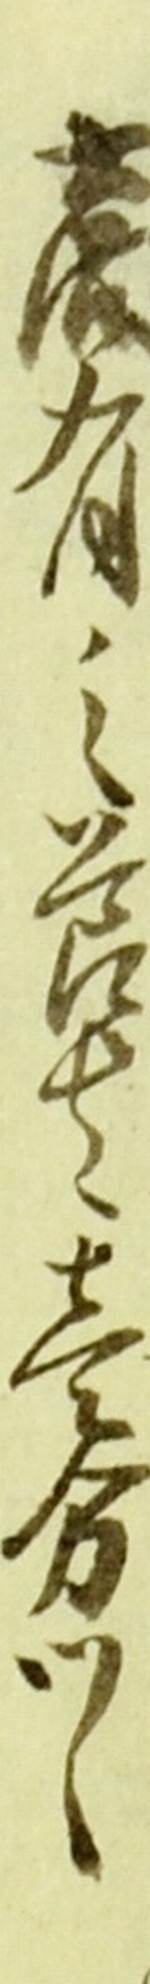商有之節者壱分ツゝ
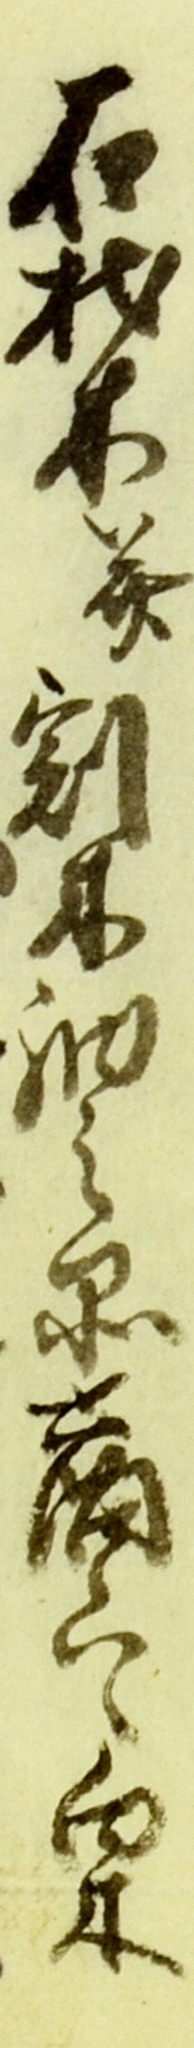右材木幷割木納之品商候ハゝ白木
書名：分一方諸運上御定法
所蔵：伊那市立高遠町図書館・合同会社AMANE
